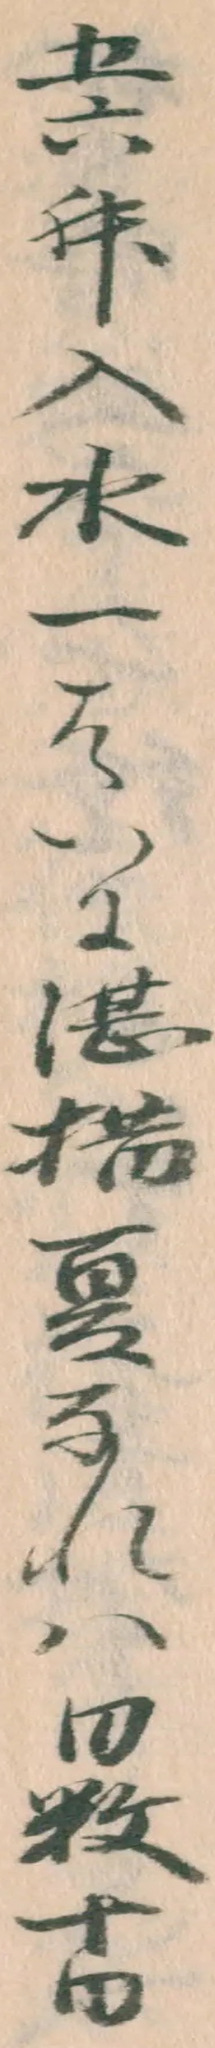五六升入水一はいに湛措く措夏なれハ日数十日
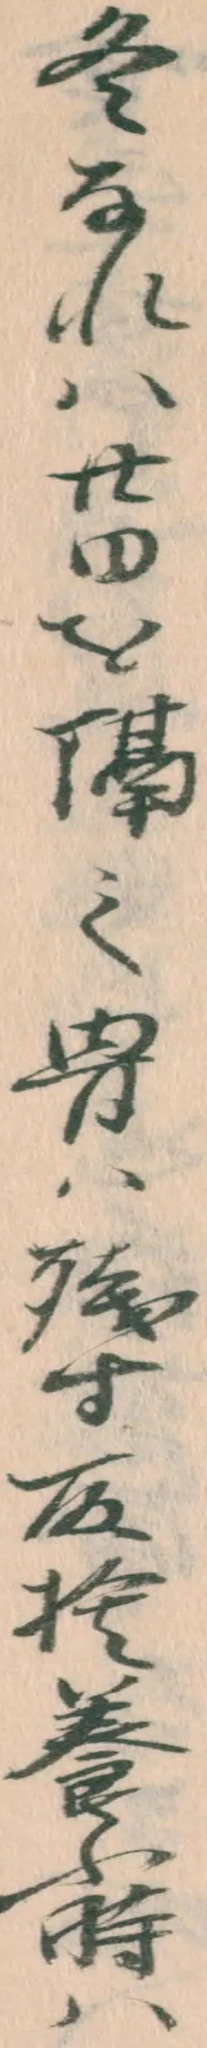冬なれハ廿日を隔て骨ハ残す取捨養ふ時ハ
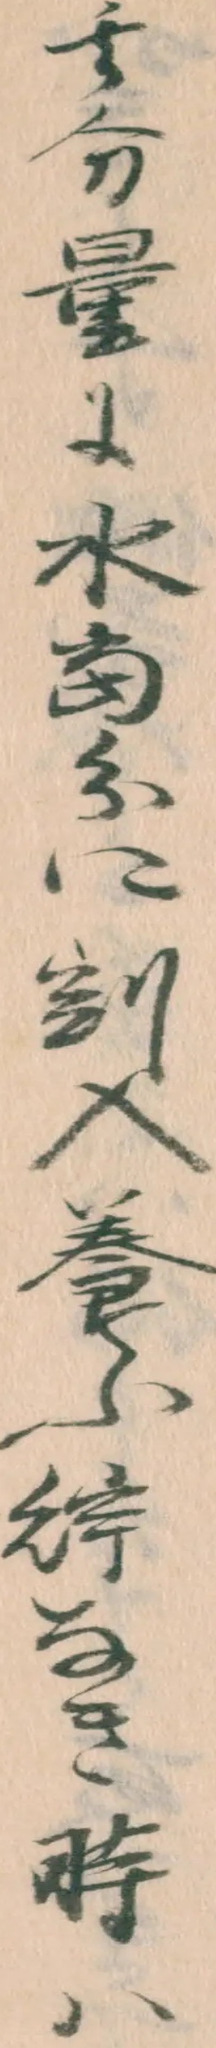其分量に水当分に割入養ふ貯なき時ハ
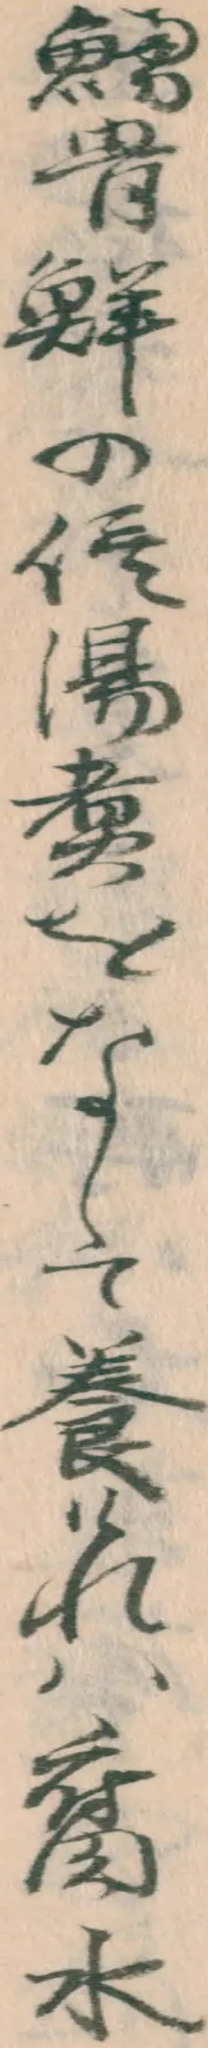鰯骨鮮の侭湯煮をなして養けれハ腐水
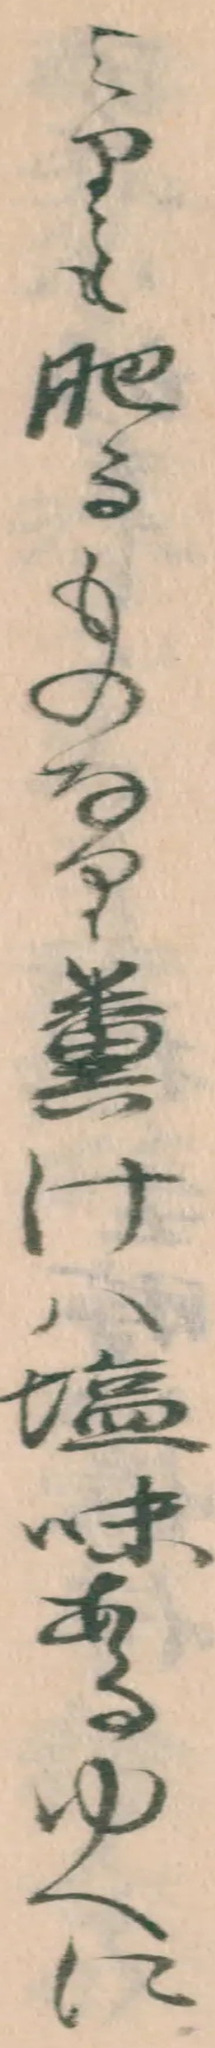よりも肥るものなり糞けハ塩味あるゆへに
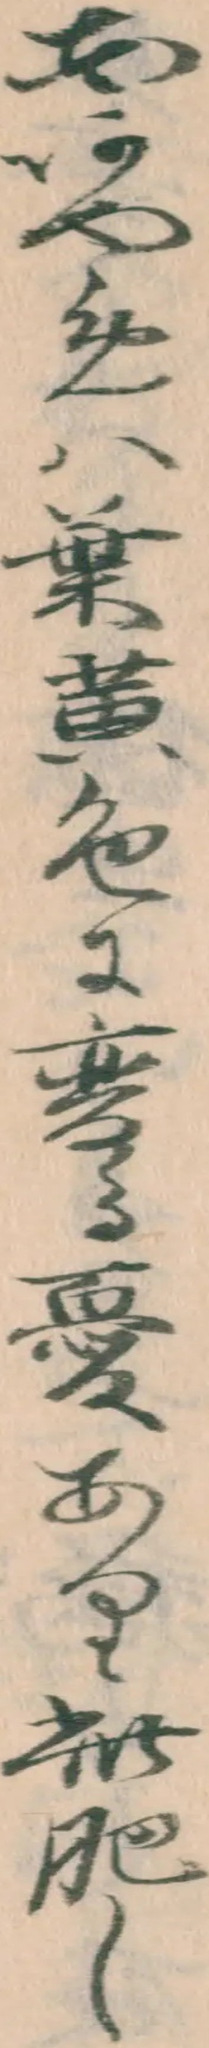花あやめハ葉黄色に変る憂あるも此肥し
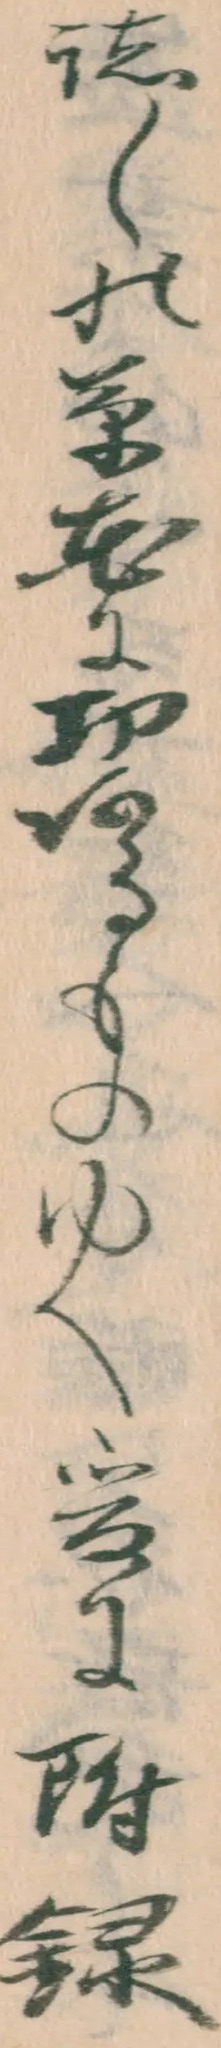諸々の草花に功あるものゆへ旁に附録
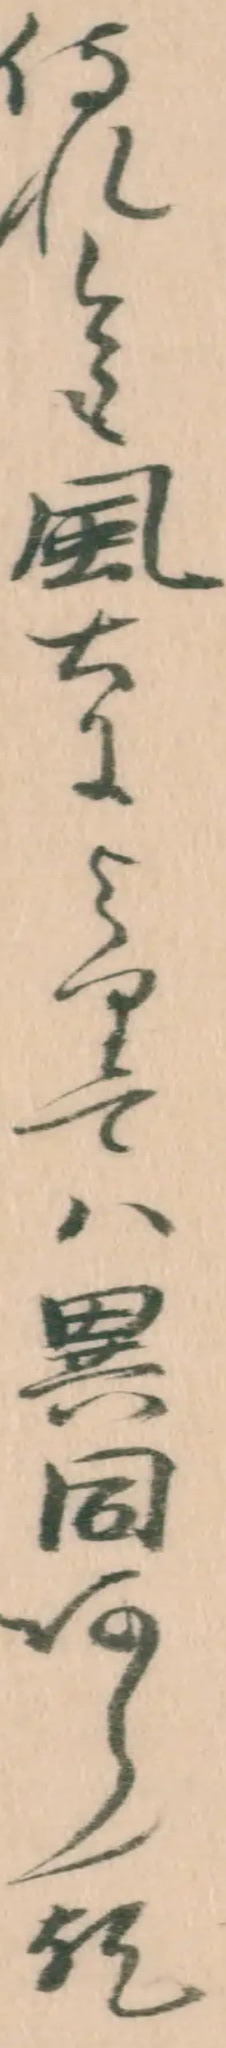あれとも風土によりてハ異同あらん哉
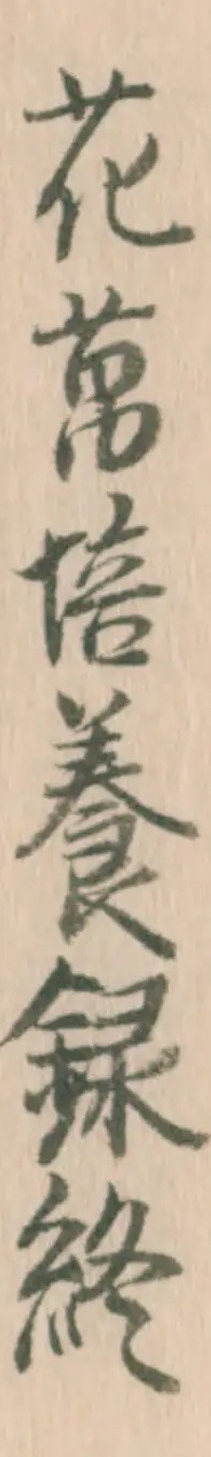花菖培養録終
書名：花菖培養録
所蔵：国立国会図書館 National Diet Library, JAPAN
